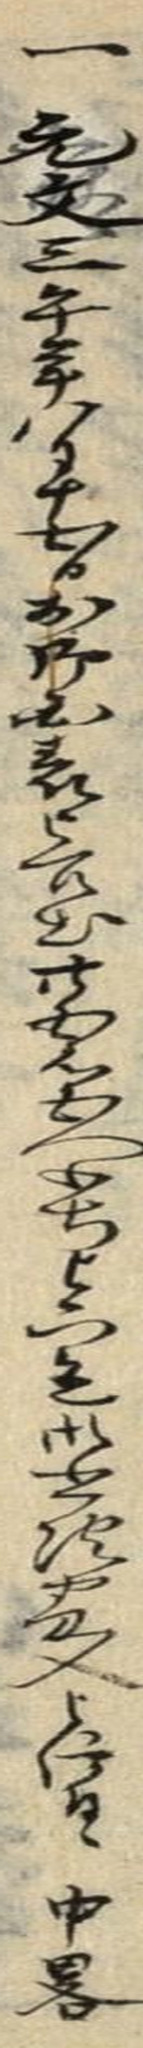一元文三午年八月十五日於御国表被召出廿五石五人ふち被下置御書院番入被仰付候中略
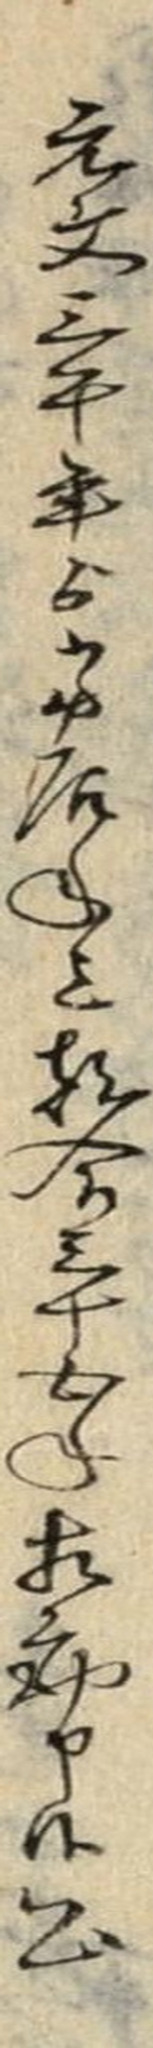元文三午年ゟ当辰年迄都合三十五年相勤申候以上
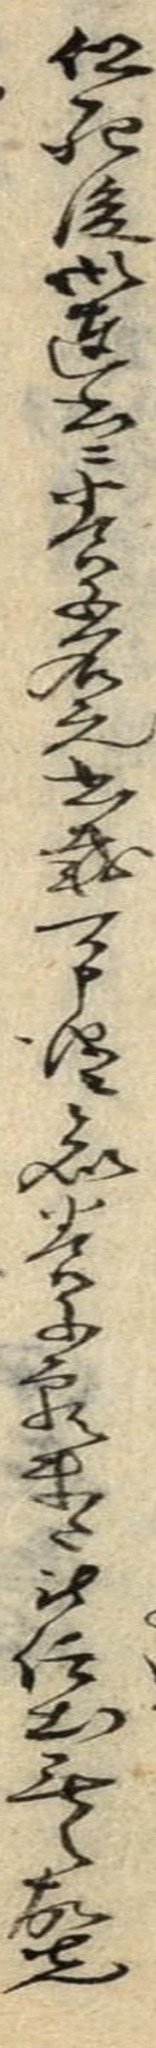但死後御達書ニ養子名元書載可申儀ニ候処養子願未た被仰出無之故先
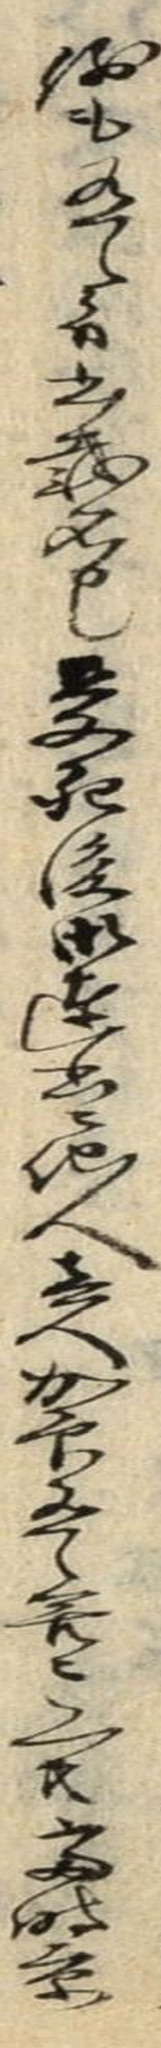例も有之ニ付書載不申候且又死後御達書ニ他人壱人加印有之筈ニ候へ共当時京
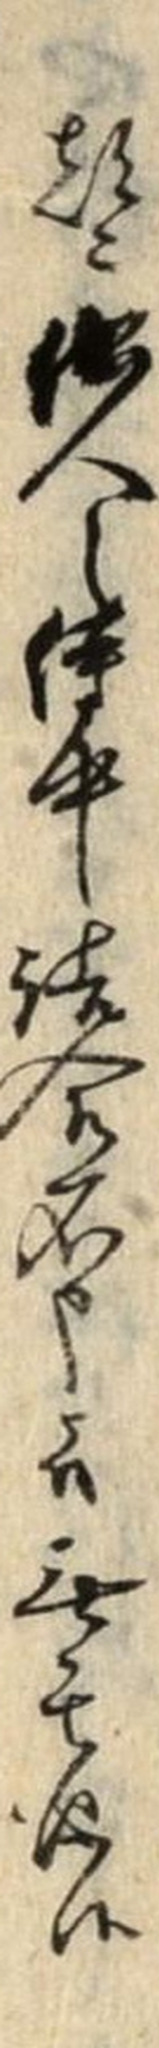都ニ他人之侍中詰合不申ニ付無其儀候
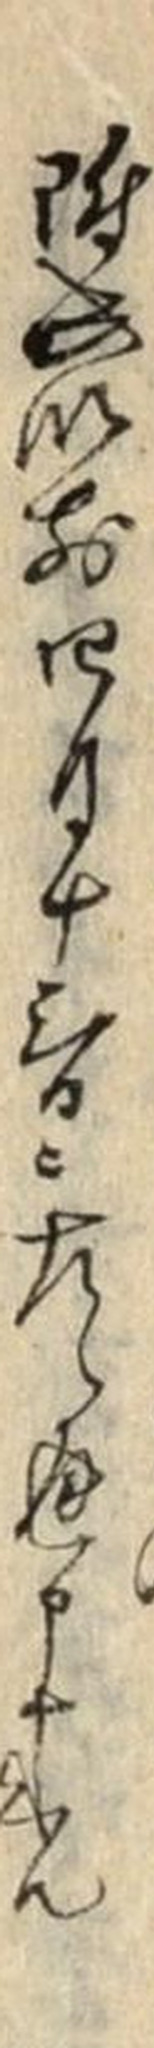附此段以前四月十三日左之通申来ル
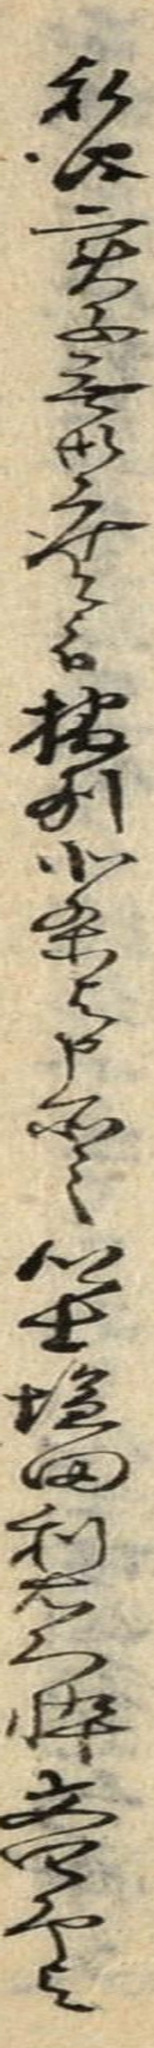私儀実子無御座候ニ付播州北条与申所之郷士塩田利右衛門悴文四郎与
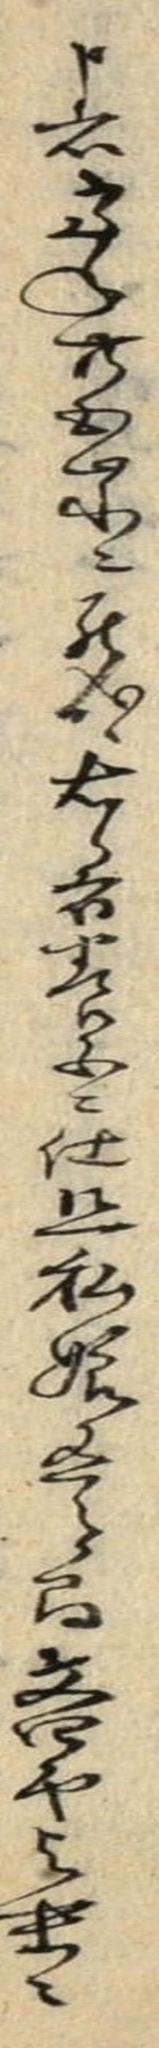申者当年廿五歳ニ罷候右之者養子ニ仕且私娘有之候間文四郎与末々
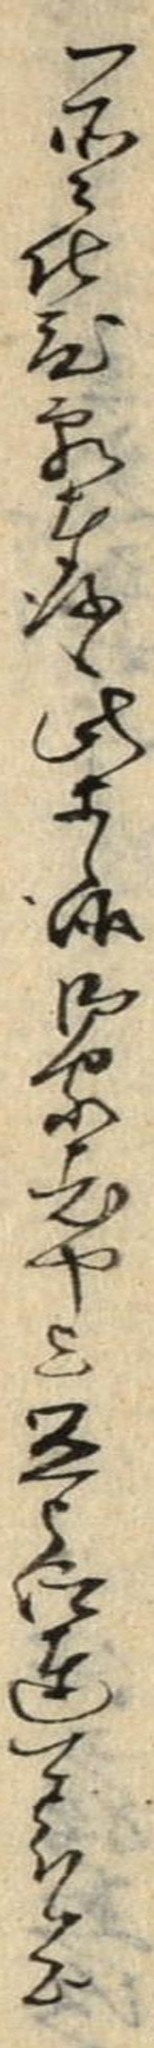一所ニ仕度願奉存候此等之趣御家老中迄宜被仰達可被下候以上

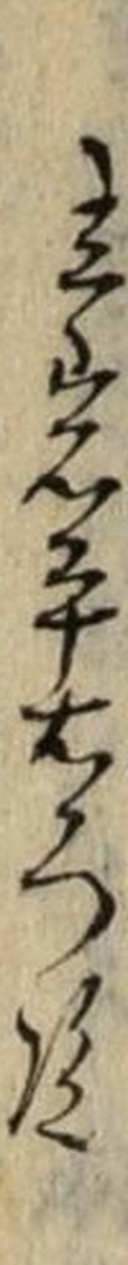立岩平右衛門殿
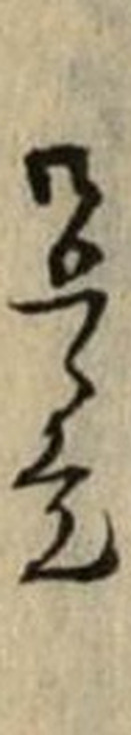口上之覚
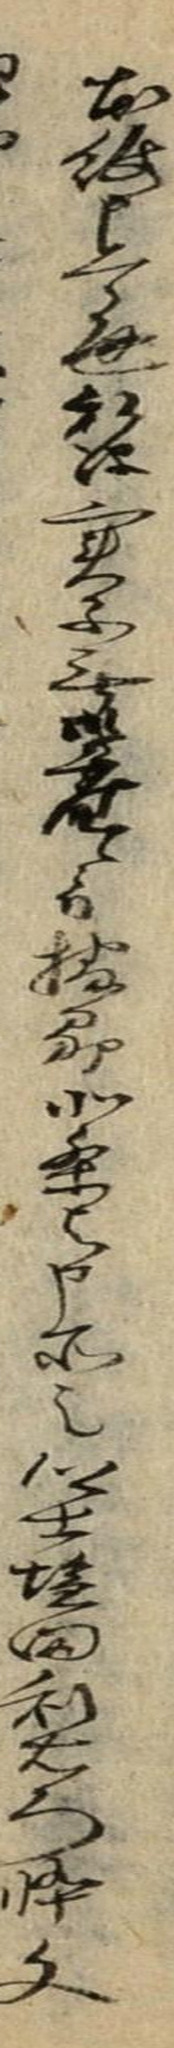本紙申上候通私儀実子無御座候ニ付播州北条与申所之郷士塩田利右衛門悴文
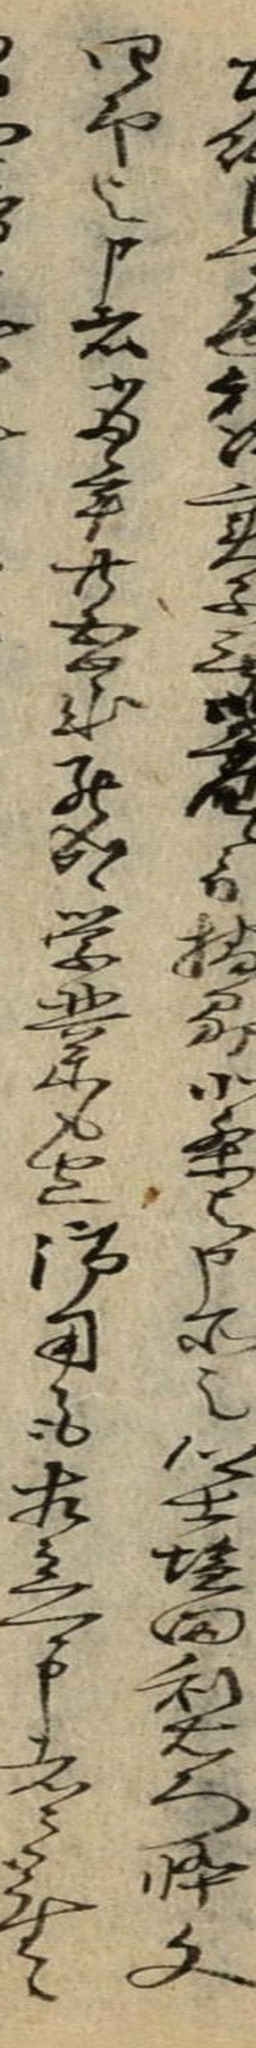四郎与申者当年廿五歳罷成候学業も宜御用ニも相立可申者ニ御座候
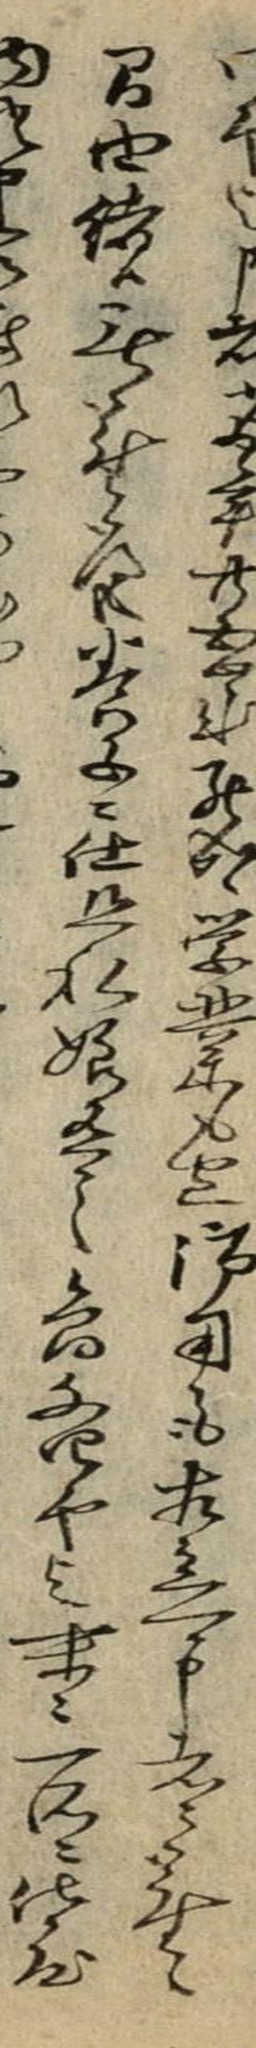間由緒ハ無御座候得共養子ニ仕且私娘有之候間文四郎与末々一所ニ仕度
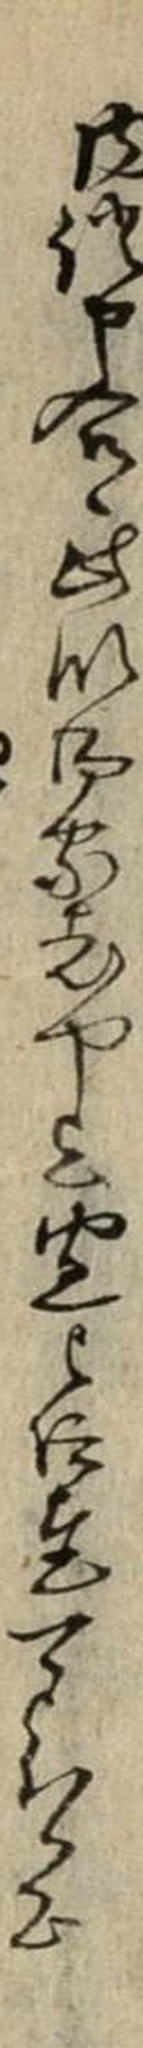内証申合候此段御家老中迄宜被仰達可被下候以上
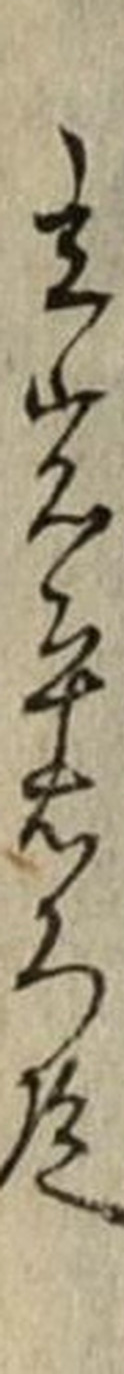立岩平右衛門殿
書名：養子縁組之部
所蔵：福井県文書館 Fukui Prefectural Archives
